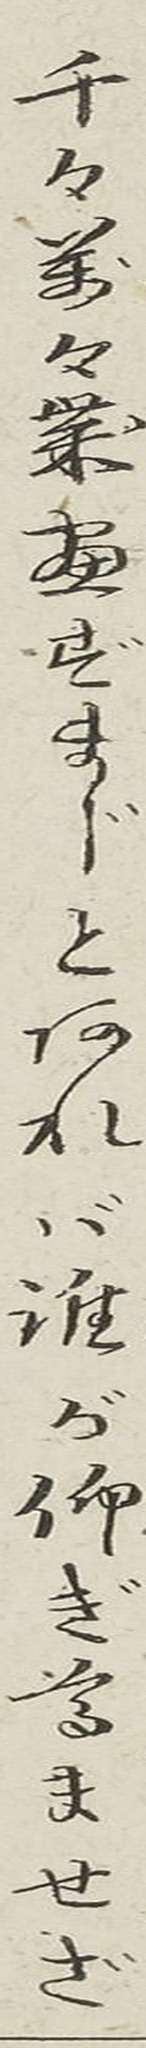千々萬々歳尽ずまじとあれば誰が仰ぎ尊ませざ
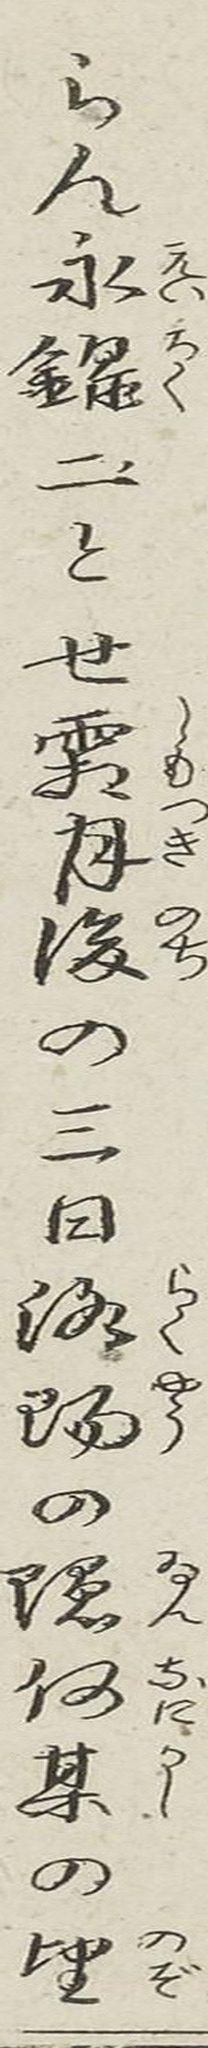らん永録二とせ霜月後の三日洛陽の隠何某の望
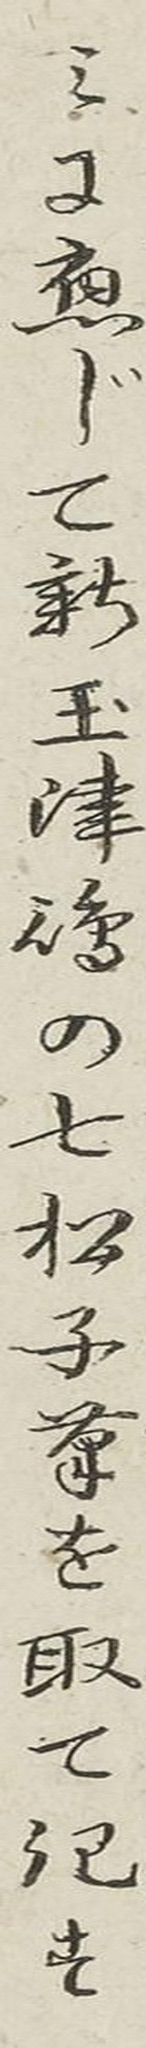みに応じて新玉津嶋の七松子筆を取て記す
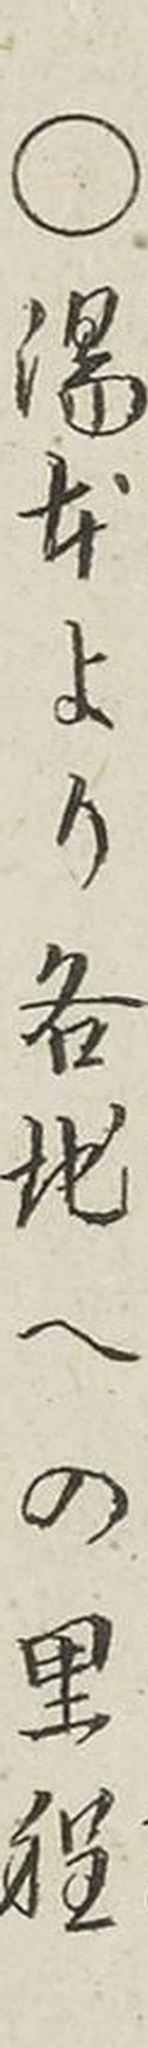○湯本より各地への里程
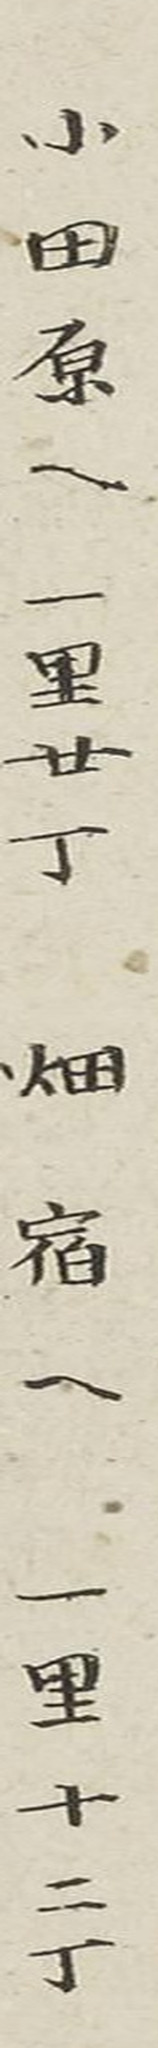小田原へ一里廿丁畑宿へ一里十二丁

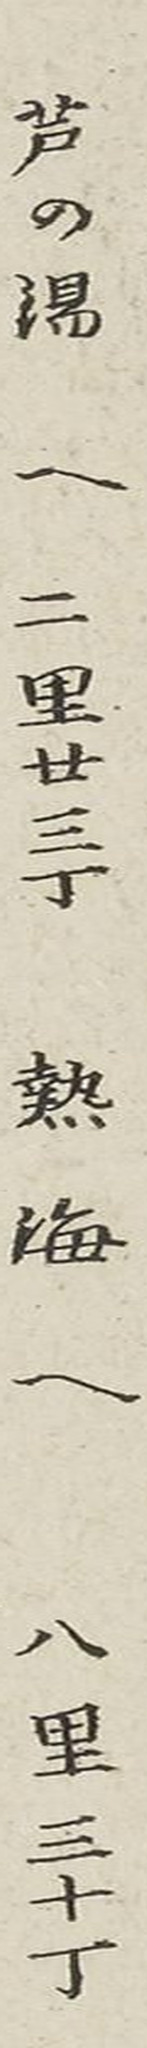芦の湯へ二里廿三丁熱海へ八里三十丁
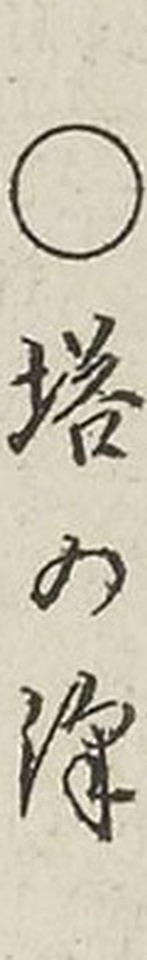〇塔の澤
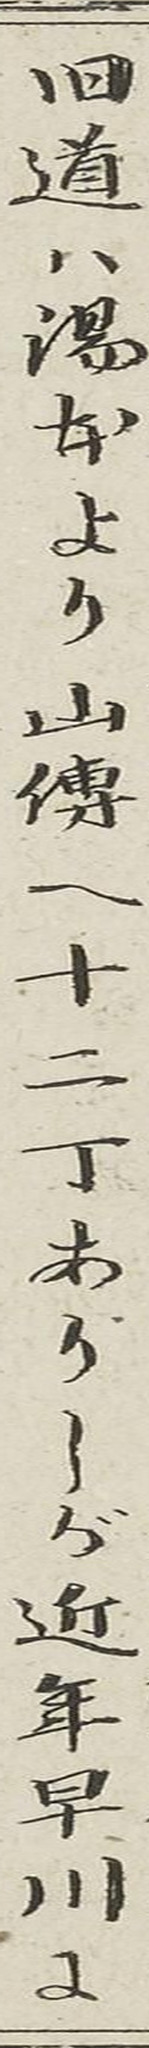旧道は湯本より山伝へ十二丁ありしが近年早川に
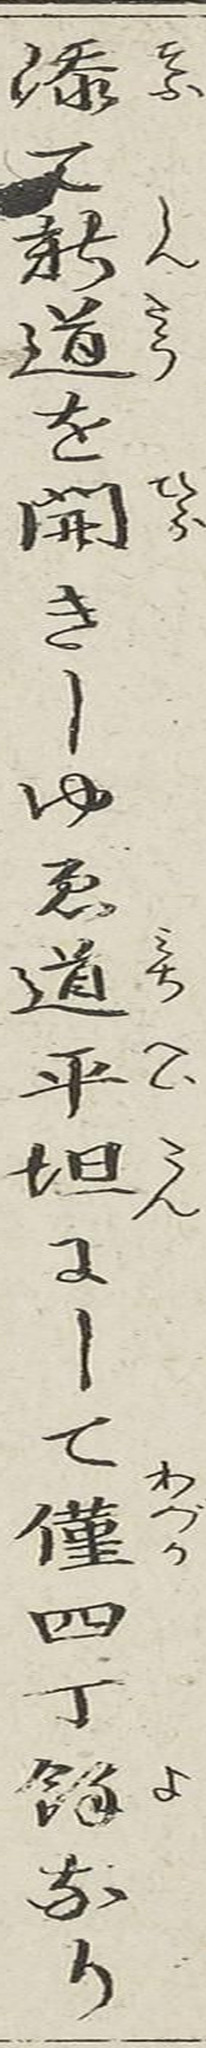添て新道を開きしゆゑ道平坦にして僅四丁余なり
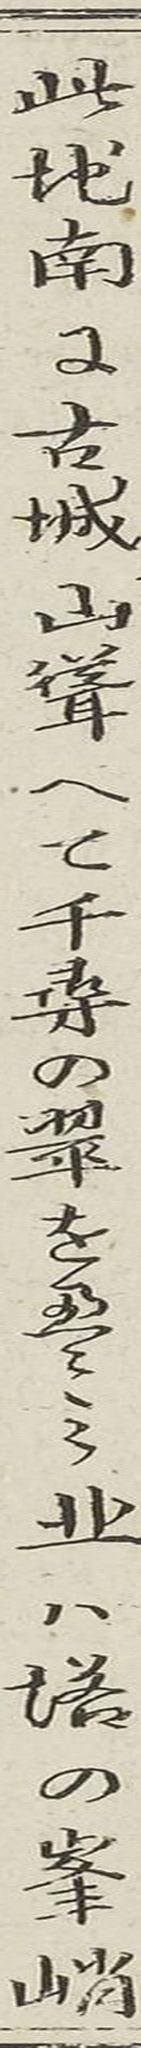此地南に古城山聳へて千尋の翠を盈すみ北は塔の峰峭
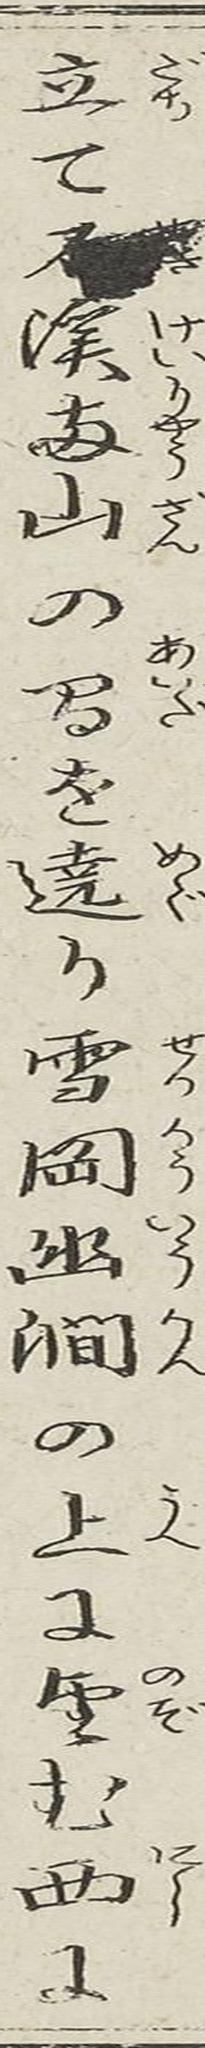立て石渓両山の間を遶り雪岡幽澗の上に望む西に
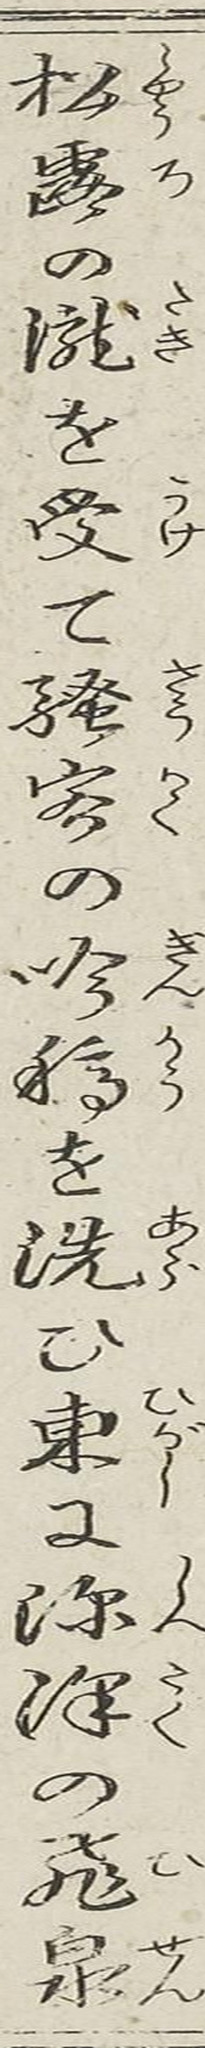松露の滝を受て騒客の吟稿を洗ひ東に深沢の飛泉
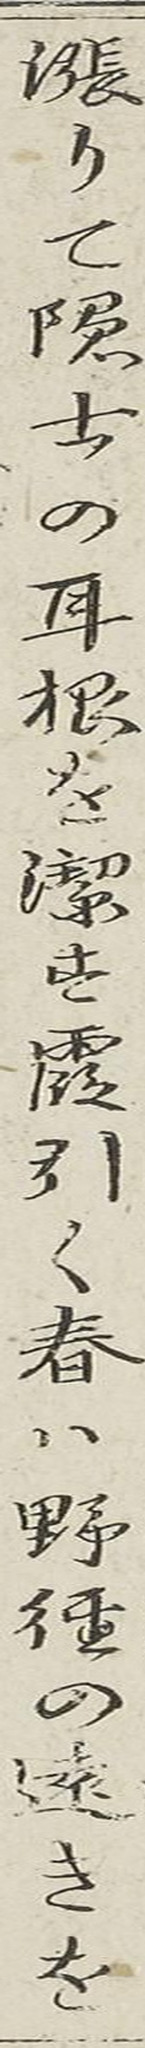漲りて隠士の耳根を潔す霞引く春は野径の遠きを
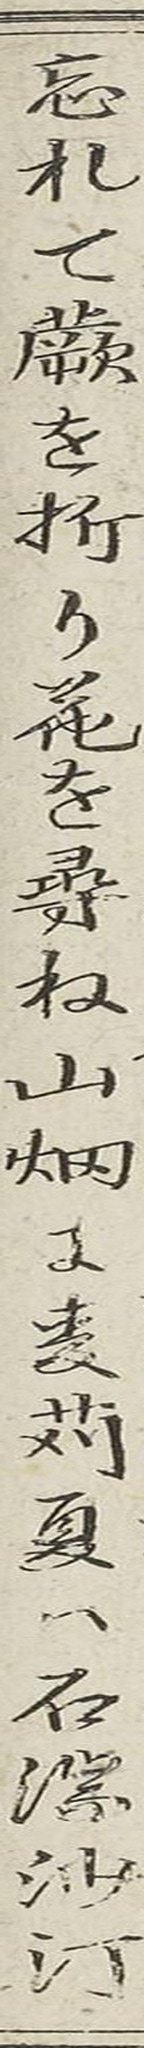忘れて蕨を折り花を尋ね山畑に麦苅夏は石澤沙汀
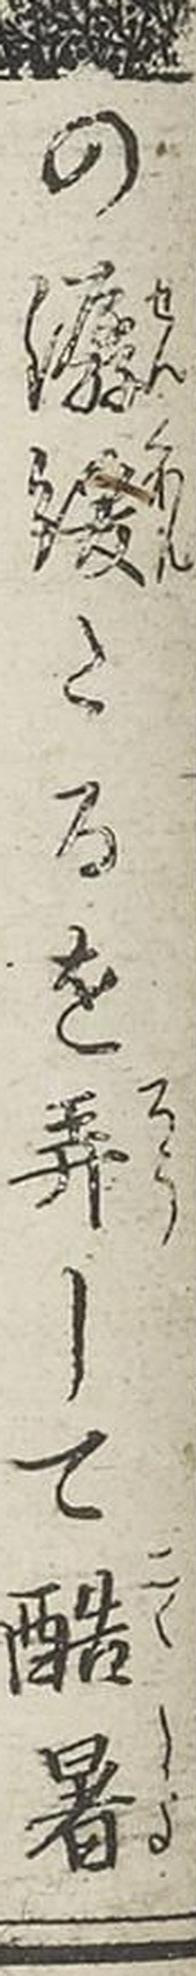塔の潺湲たるを弄して酷暑
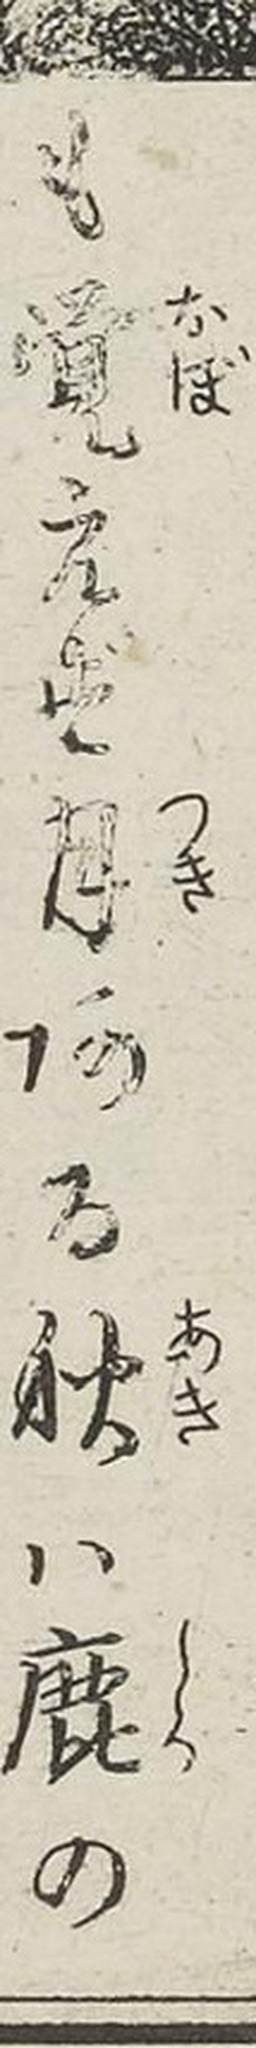のも覚えず月ある秋は鹿の
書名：箱根温泉誌　全
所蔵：東京大学地震研究所図書室 Earthquake Research Institute Library, The University of Tokyo, JAPAN
